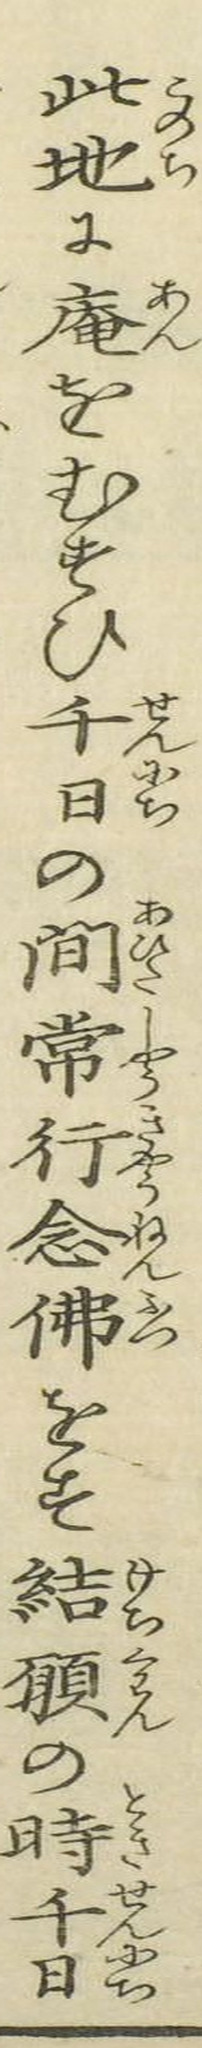此地に庵をむすひ千日の間常行念仏をす結願の時千日
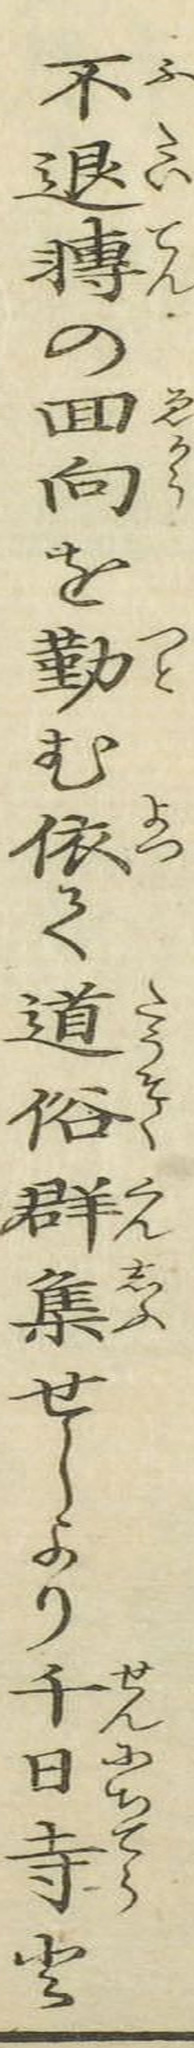不退転の回向を勤む依て道俗群集せしより千日寺と
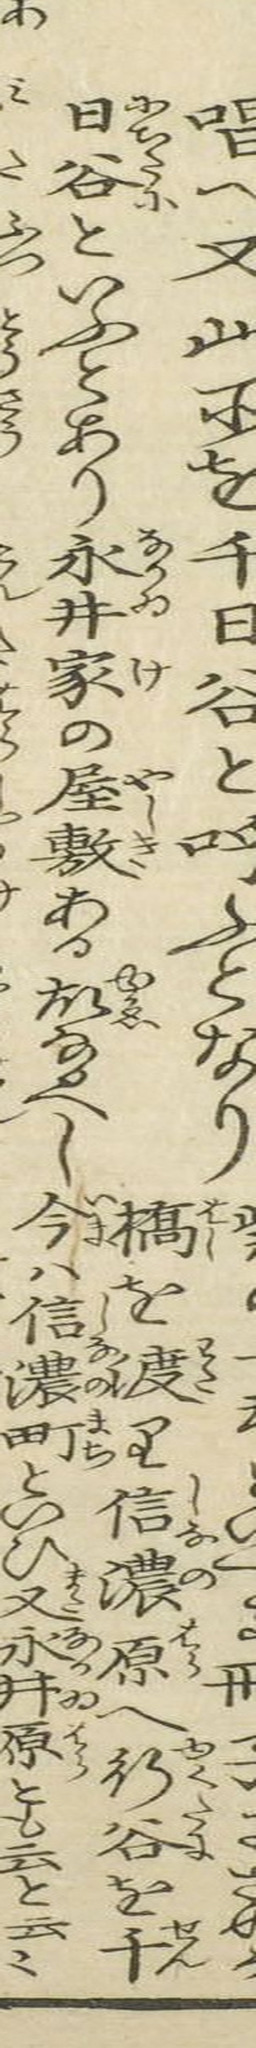日谷といふとあり永井家の屋敷ある故なるへし今は信濃町といひ又永井原とも云と云々
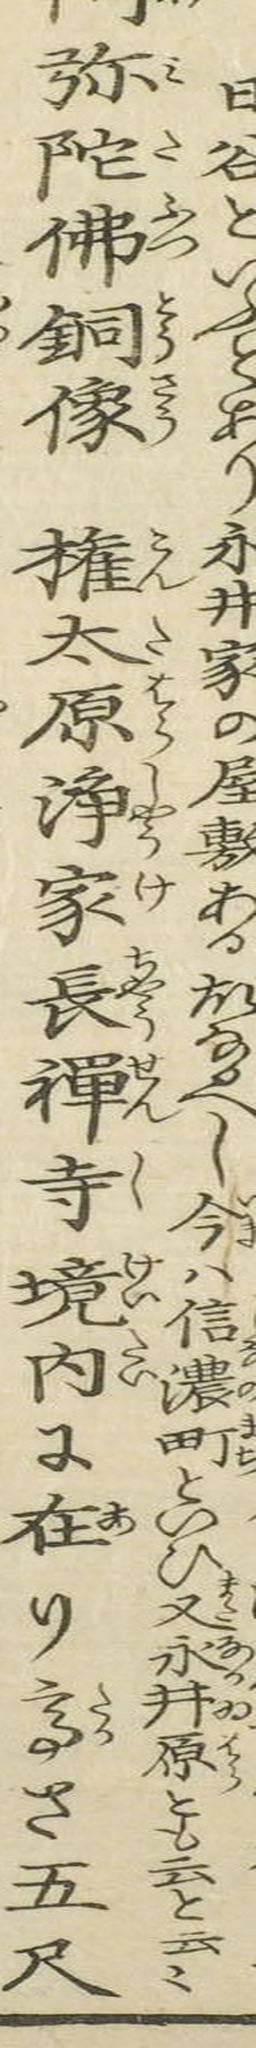阿弥陀仏銅像権太原浄家長禅寺境内に在り高さ五尺
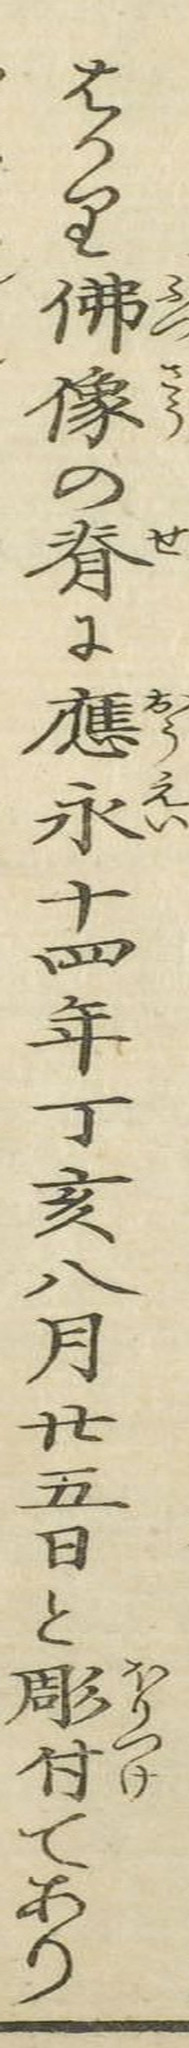はかり仏像の脊に応永十四年丁亥八月廿五日と彫付てあり
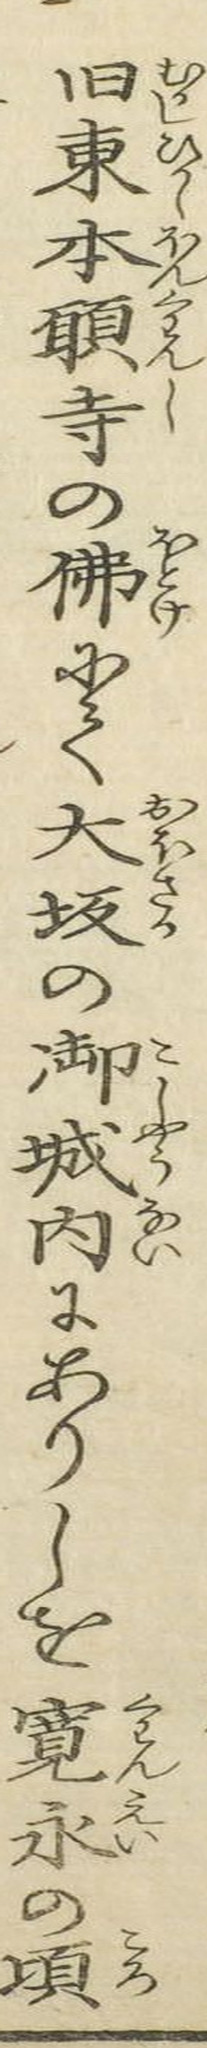旧東本願寺の仏にて大坂の御城内にありしを寛永の頃
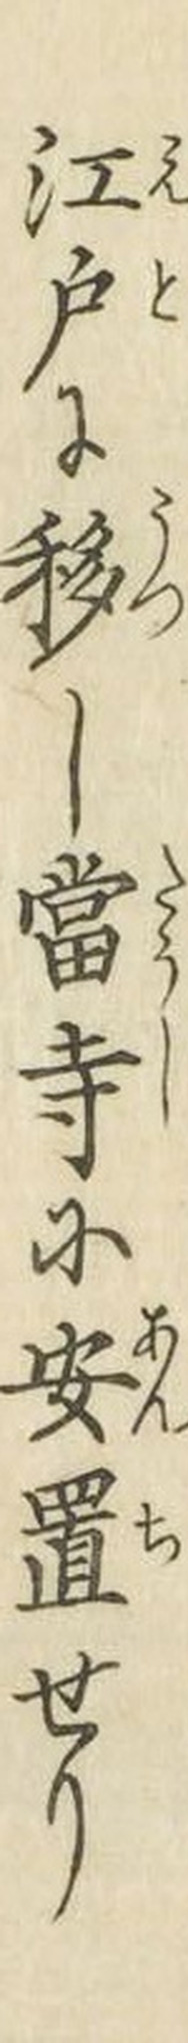江戸に移し当寺に安置せり
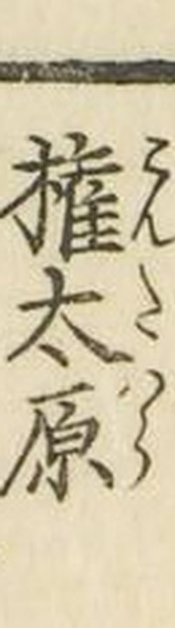権太原
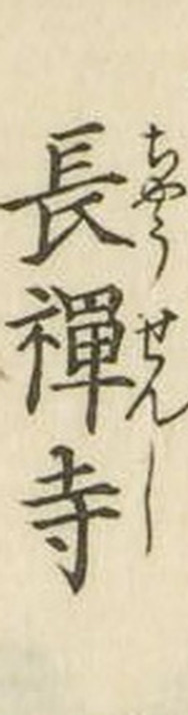長禅寺

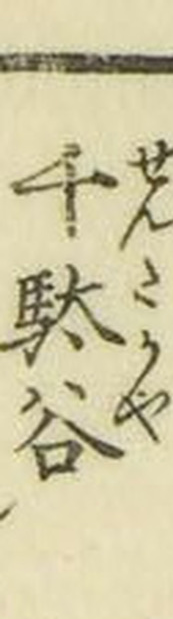千駄谷
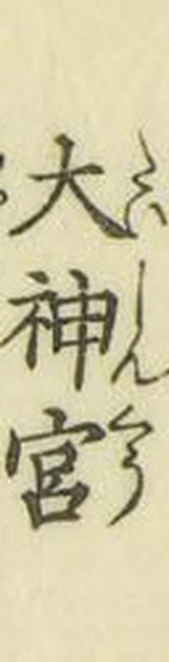大神宮
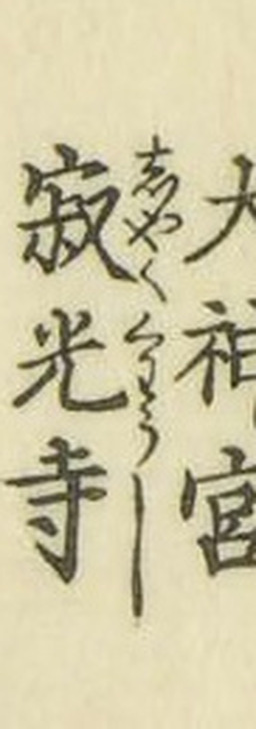寂光寺
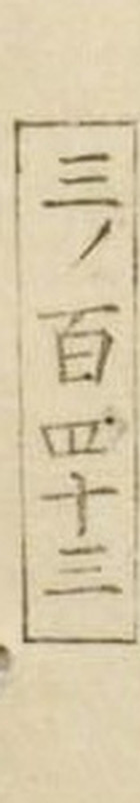三ノ百四十三
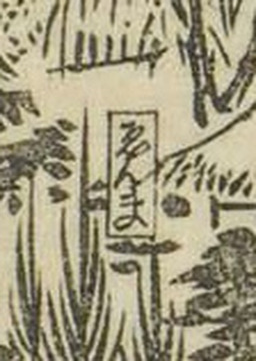ゑんま

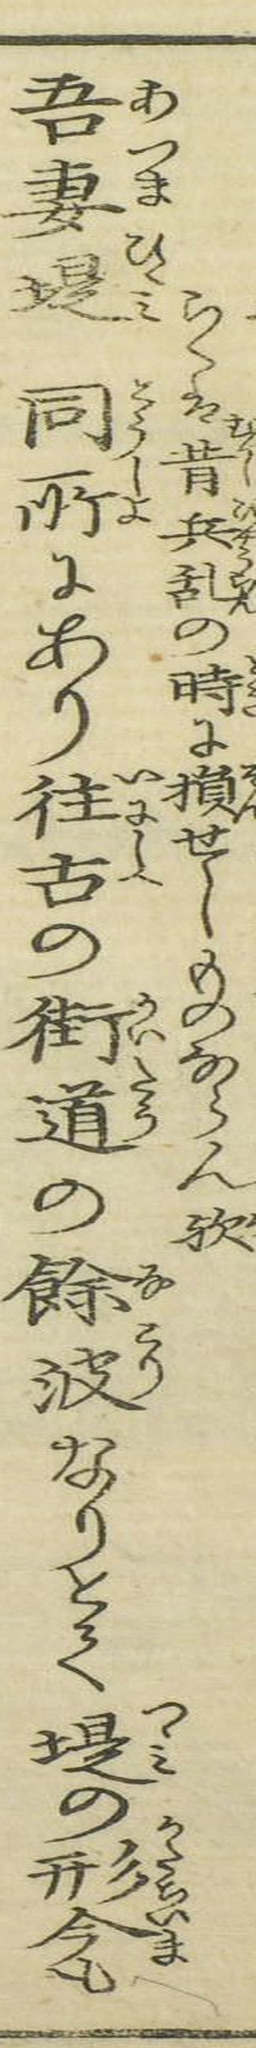吾妻堤同所にあり往古の街道の余波なりとて堤の形今も
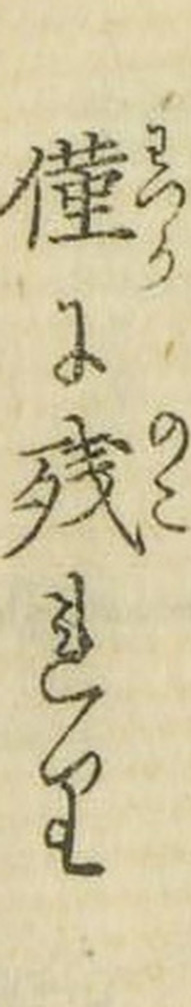僅に残れり
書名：江戸名所図会 20巻 巻之9
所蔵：東京学芸大学教育コンテンツアーカイブ
